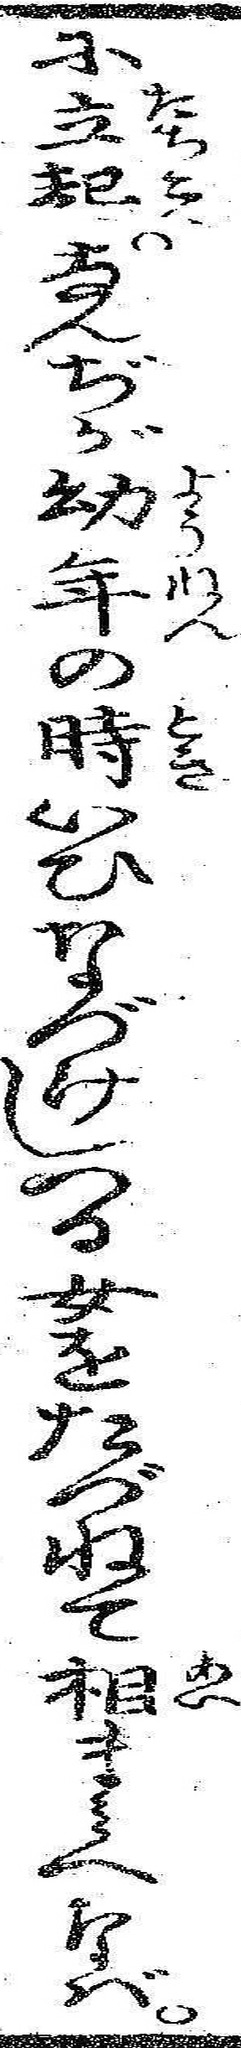に立越。なんぢが幼年の時いひなづけしつる女をたづねて相まみへなば。
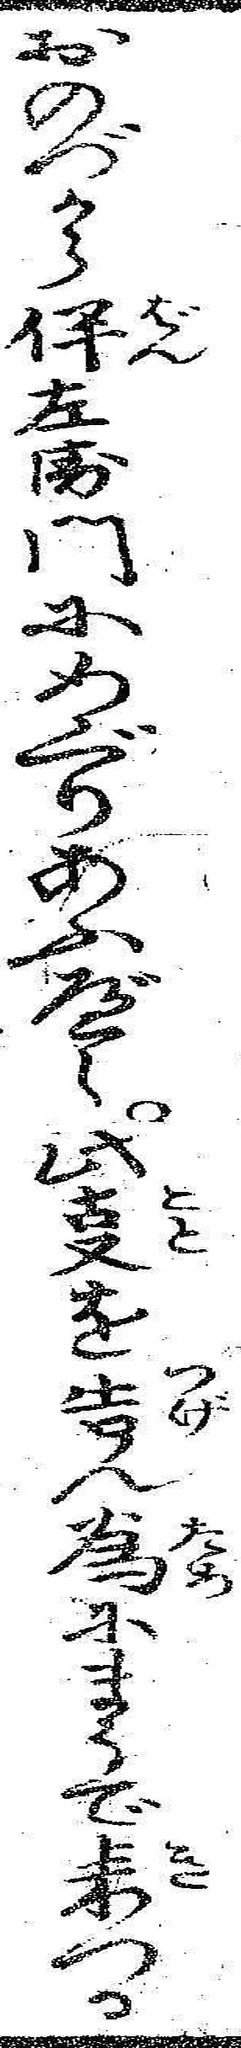おのづから伴左衛門にめぐりあふべし。此事を告ん為にまうで来つる
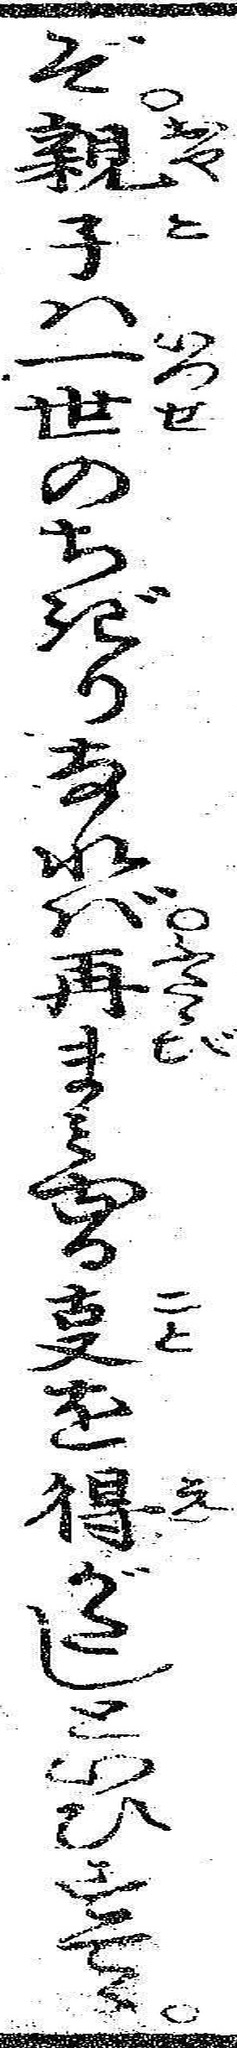ぞ。親子は一世のちぎりなれば。再まみゆる事を得がたしといひすてゝ。
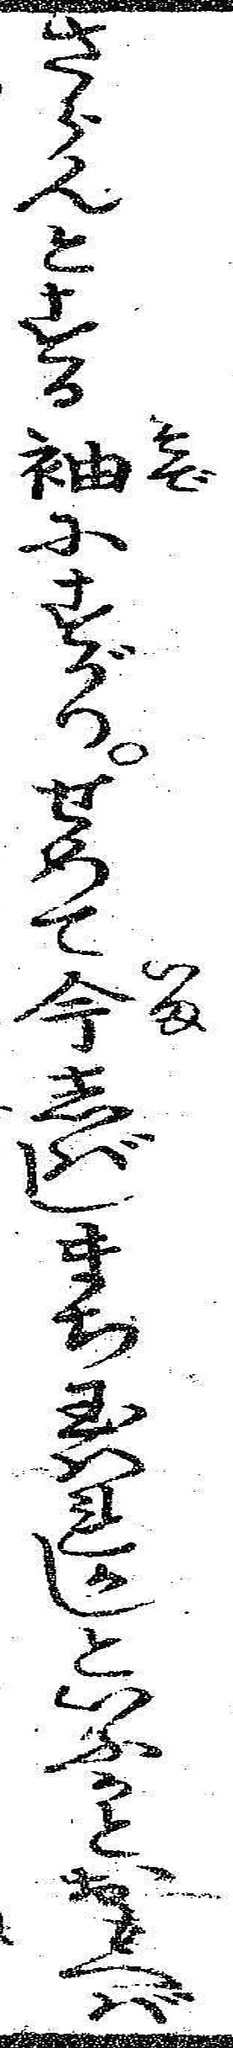さらんとする袖にすがり。せめて今しばしまち玉はれかしといふかとおもへば
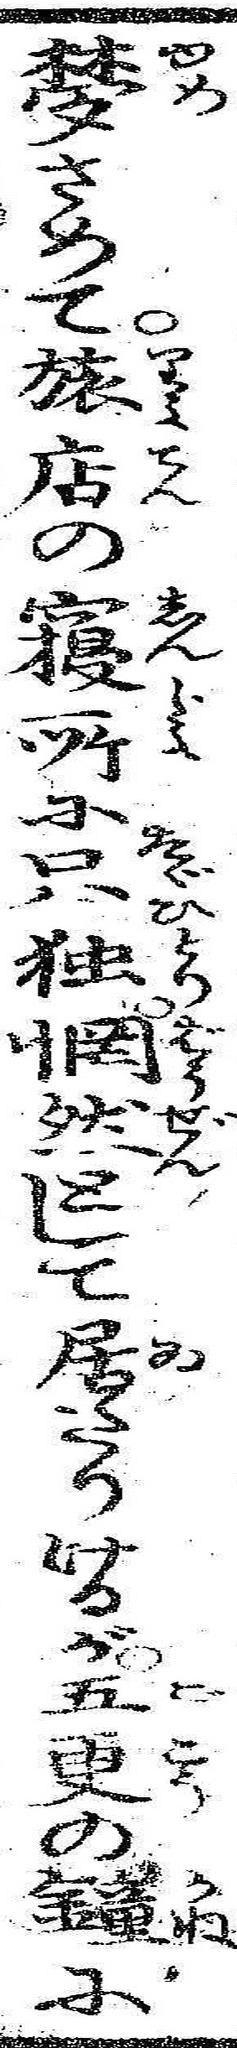夢さめて。旅店の寝所に只独。惘然として居たりけるが。五更の鐘に

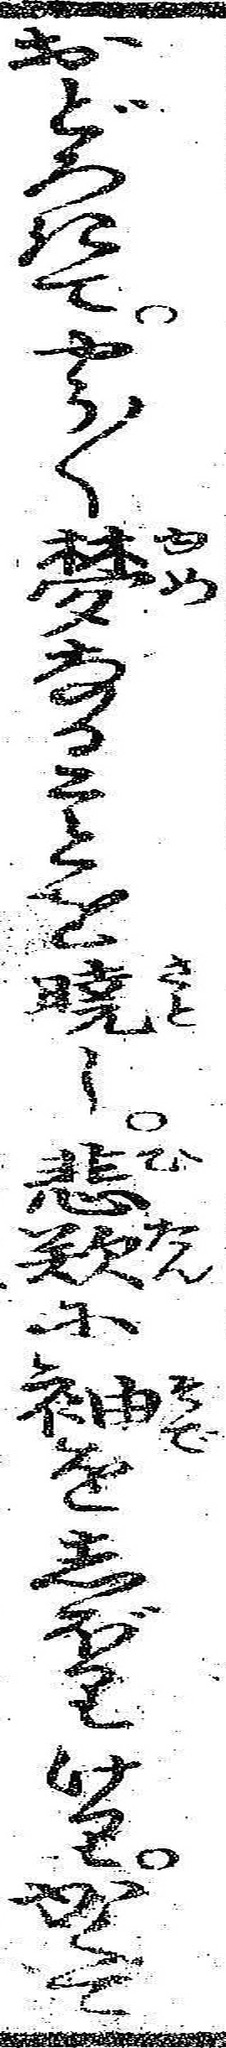おどろきて。やう〳〵夢なることを暁し。悲歎に袖をしぼりけり。かくて
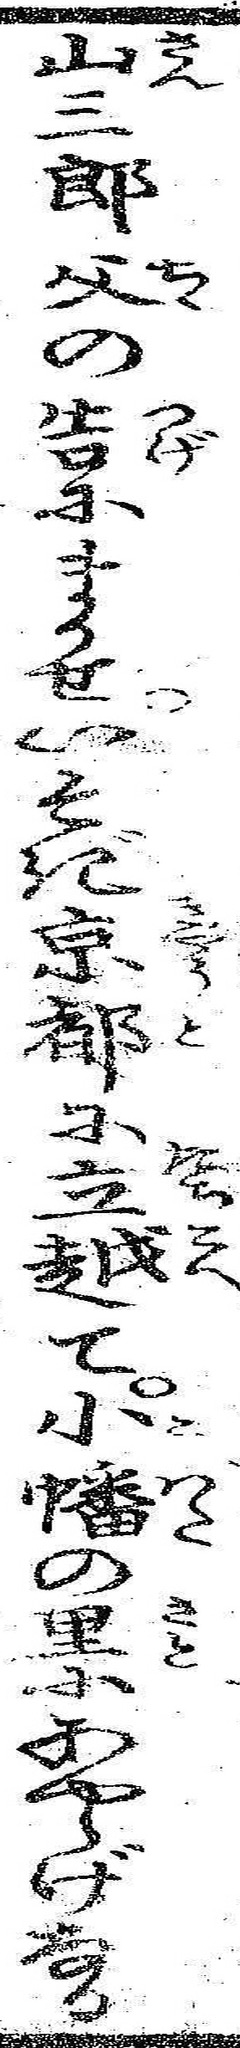山三郎父の告にまかせ。いそぎ京都に立越て。小幡の里にあやしげなる
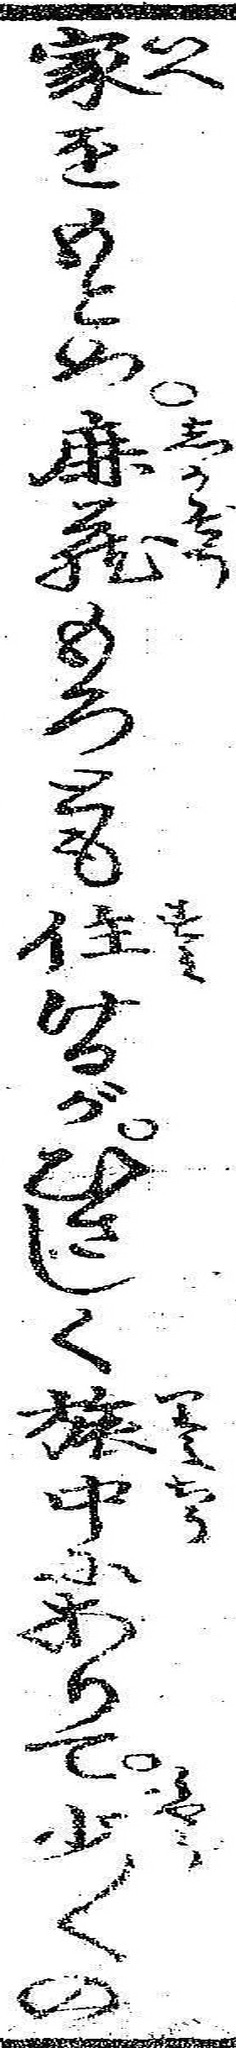家をもとめ。鹿蔵もろとも住けるが。ひさしく旅中にありて。少〳〵の
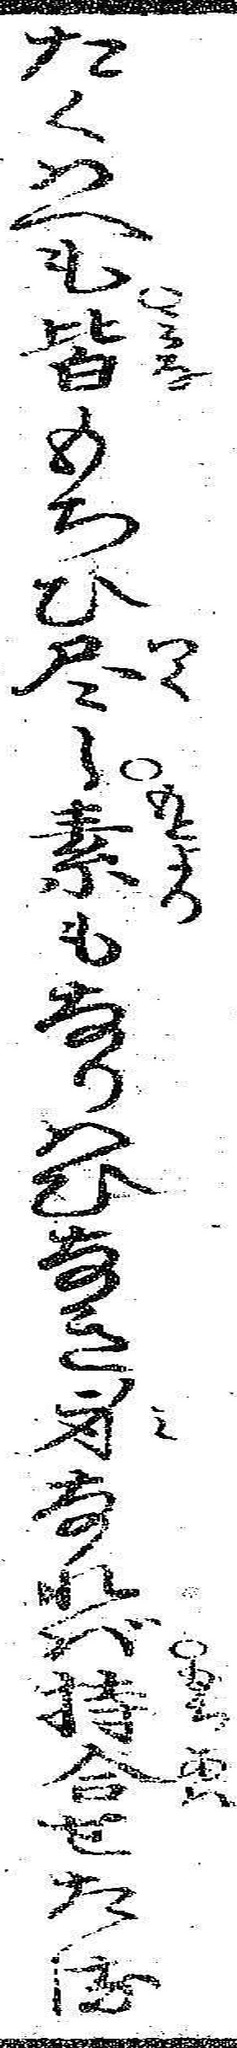たくはへも。皆もちひ尽し。素もなりはひなき身なれば。持合せたる
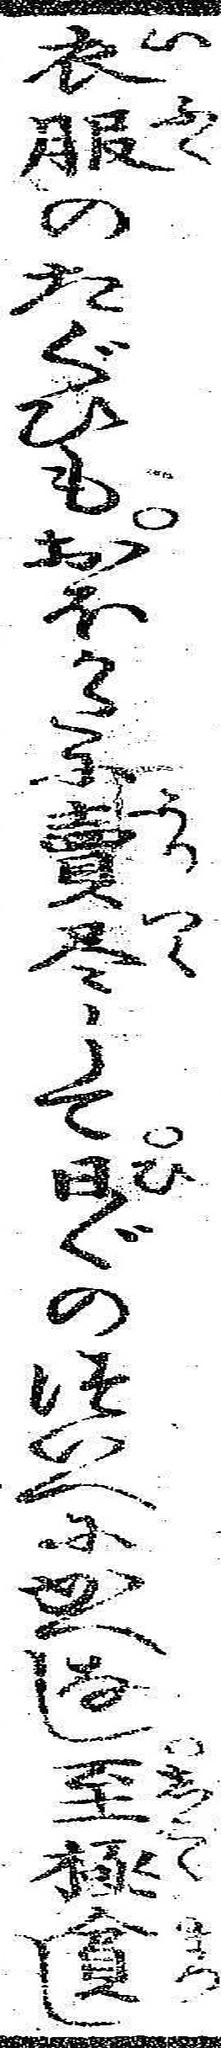衣服のたぐひも。おほかたに売尽して。日〲のついへにかへなし。至極貧し
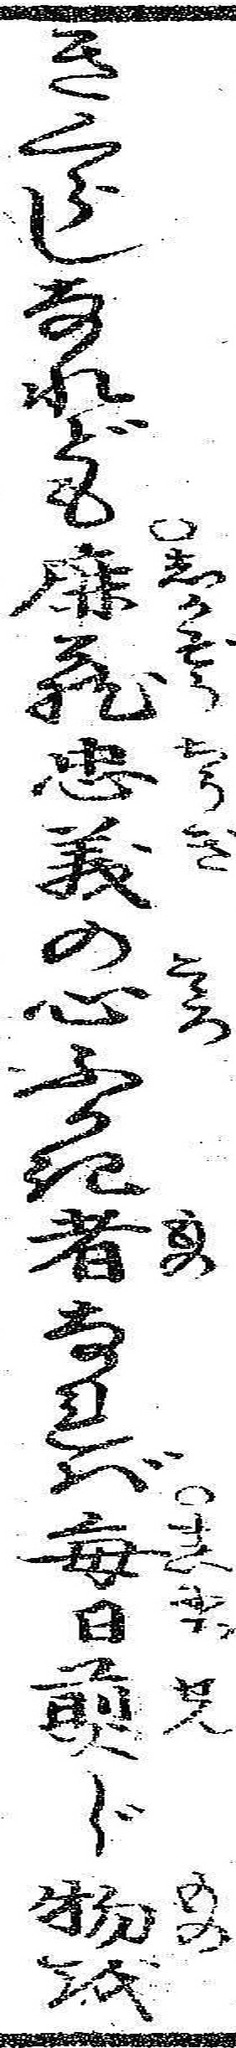きくらしなれども。鹿蔵忠義の心ふかき者なれば。毎日煎じ物を
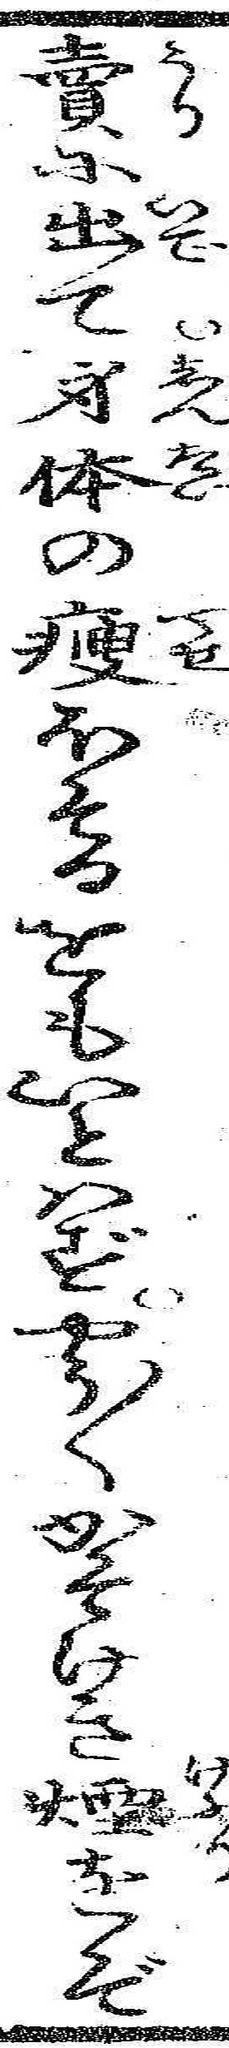売に出て。身体の痩ほそるをもいとはず。やう〳〵かそけき煙をぞ
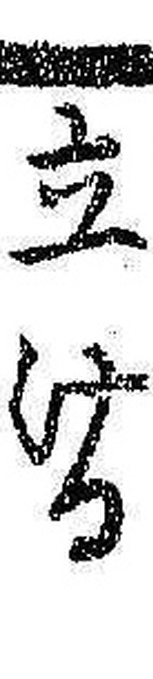立ける
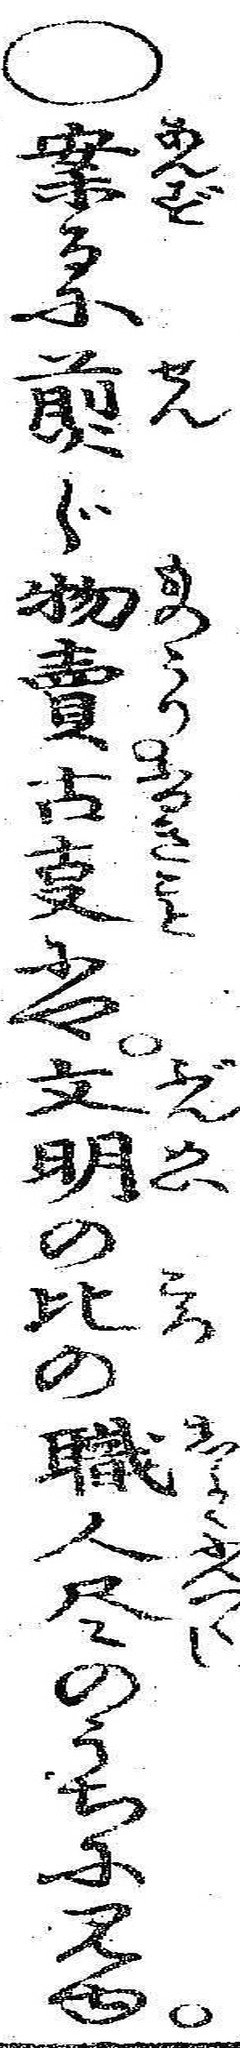○案るに煎じ物売。古事にや。文明の比の職人尽のうちに見ゆ。
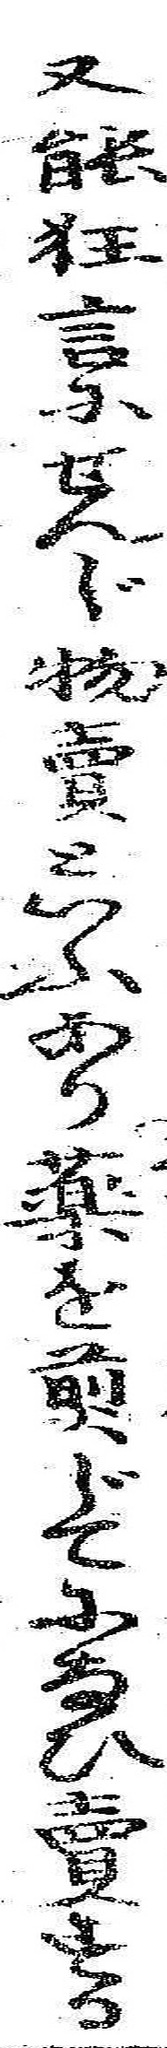又能狂言にせんじ物売といふあり。薬を煎じてになひ売する
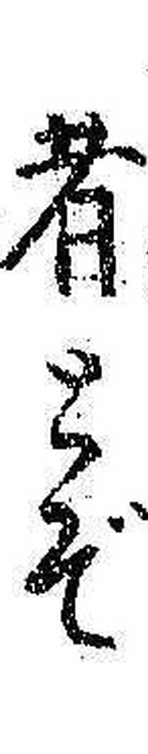者とぞ
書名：昔話稲妻表紙
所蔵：国文学研究資料館
